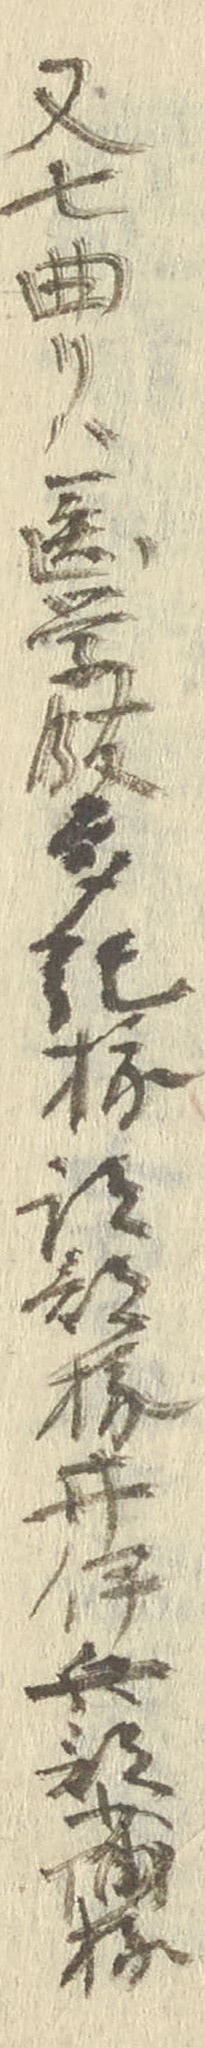又七曲りハ医学館多紀様跡部様井伊兵部少輔様
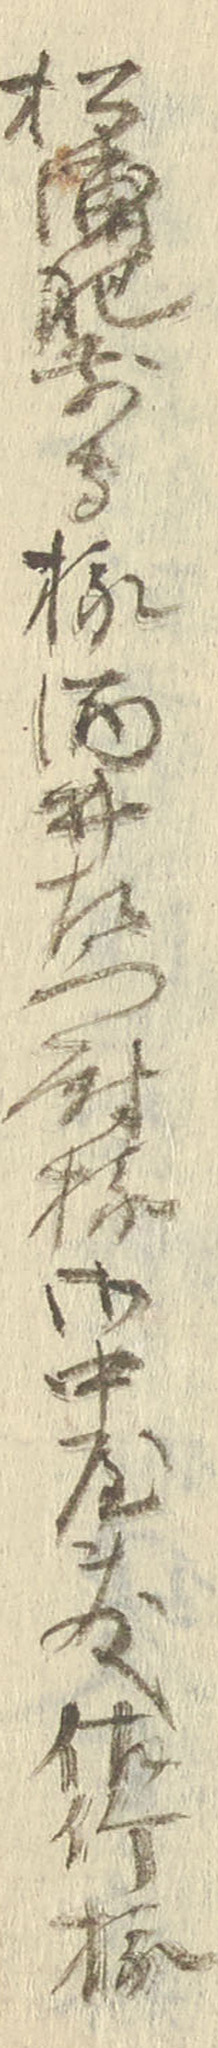松浦肥前守様酒井左衛門尉様御中屋敷佐竹様
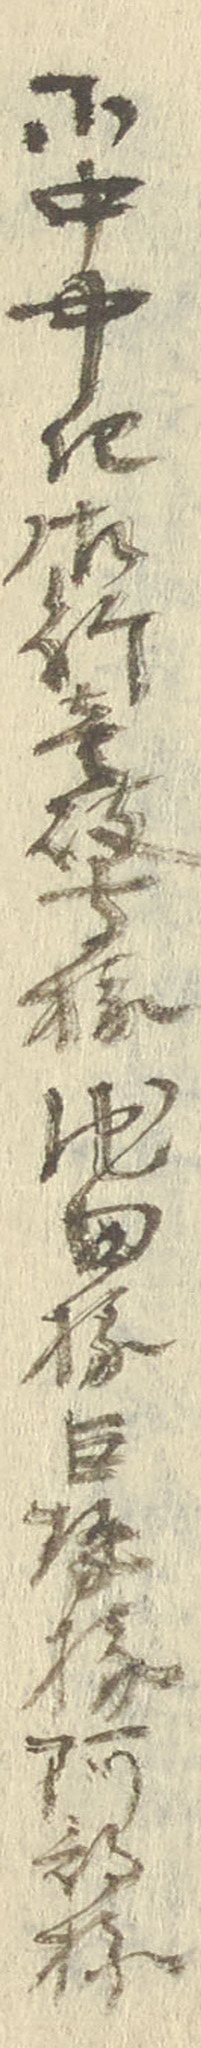御中やしき佐竹壱岐守様池田様巨？様阿部様
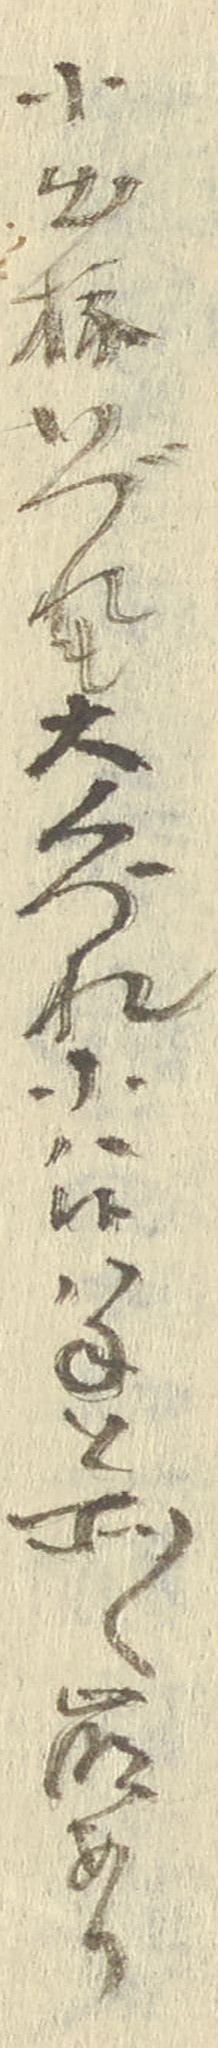小出様いづれも大くづれにハ候ハねと所〳〵崩あり
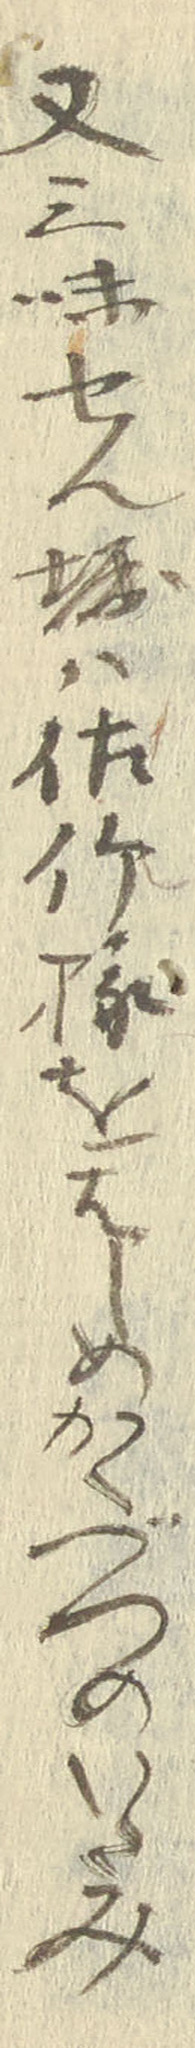又三味セん堀ハ佐竹様をはじめかくべつのいたみ
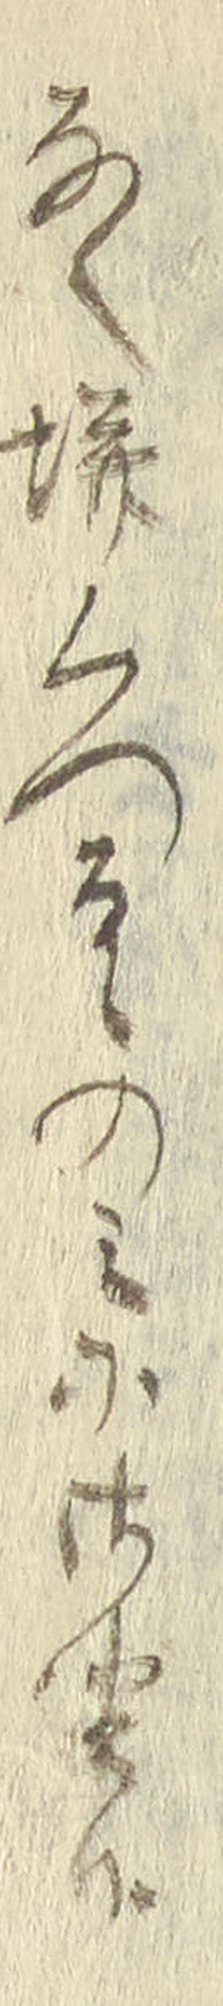なく塀くつるゝのミに御坐候
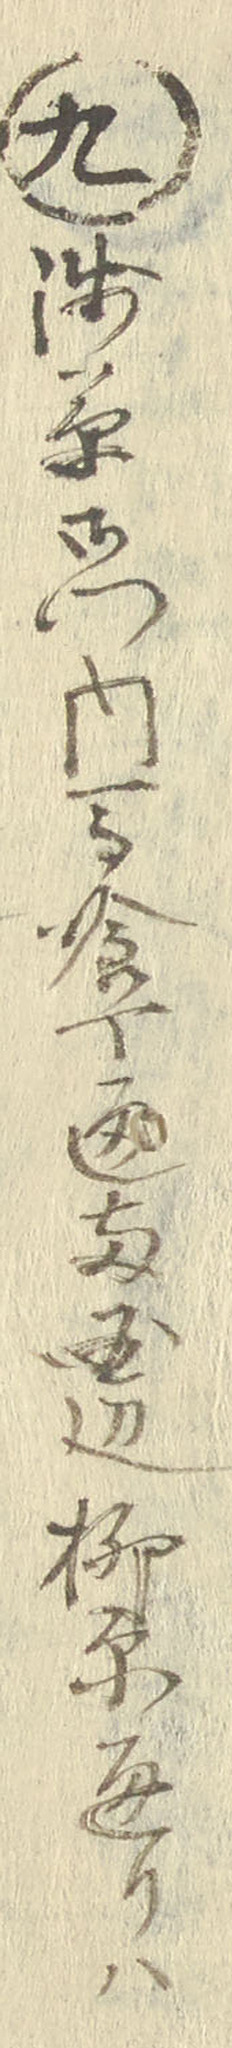九浅草御門内馬喰丁通両国辺柳原通りハ
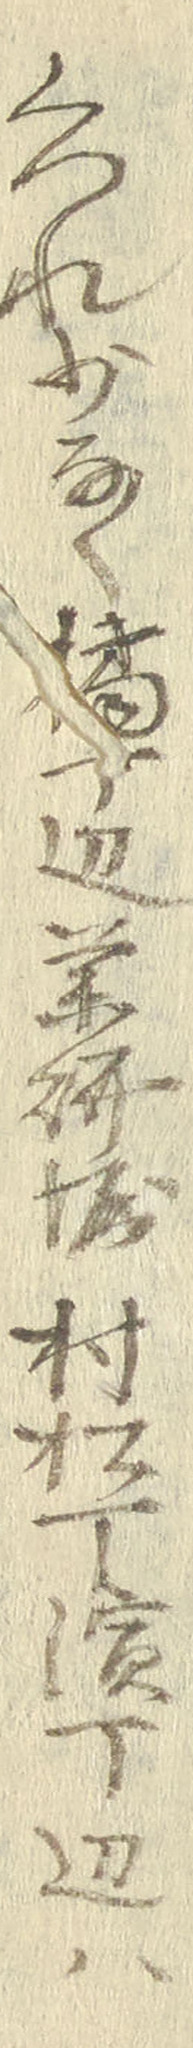くつれ少なく橋丁辺薬研堀村松丁濱丁辺ハ
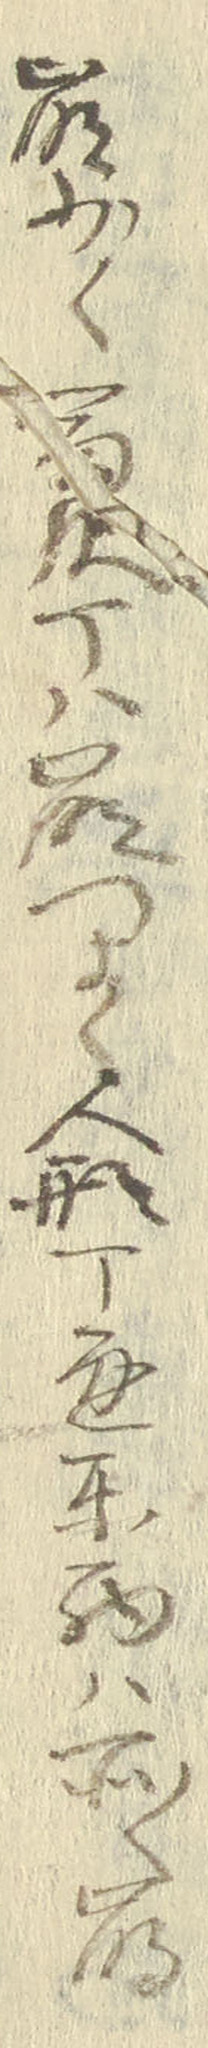崩少く富沢丁ハ崩つよく人形丁通東西ハ所〳〵崩
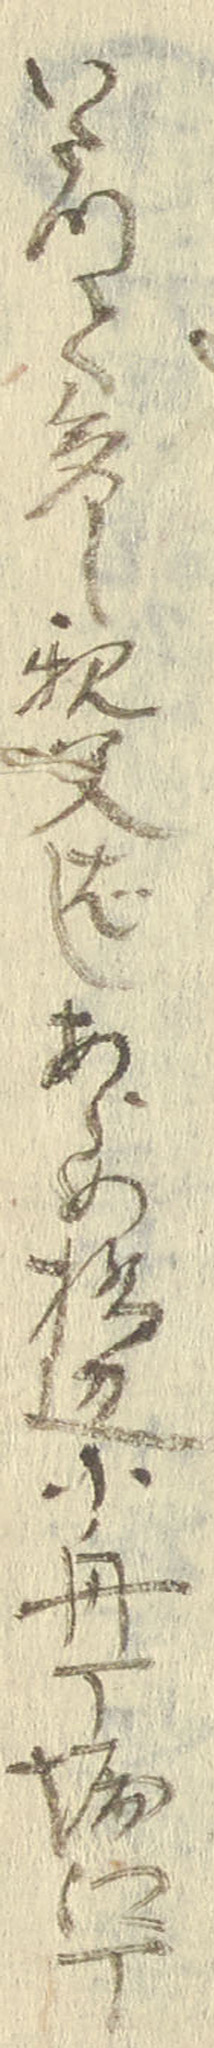いたつて多し親父ばしあらめ橋辺小舟丁堀江丁
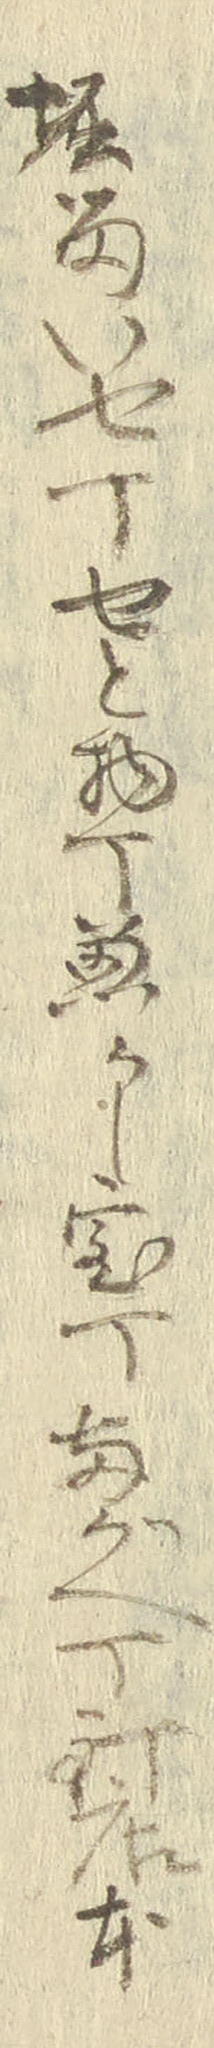堀留いセ丁セと物丁魚かし宝丁両がへ丁釘店本
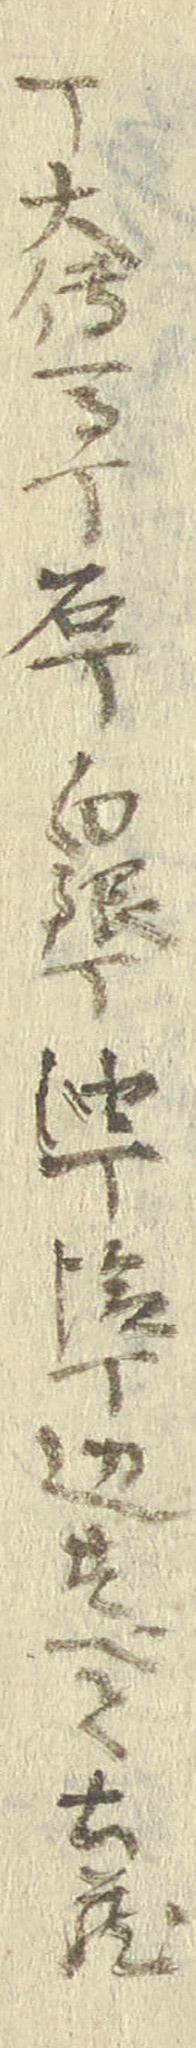丁大傳馬丁石丁白銀丁油丁塩丁辺すべて土蔵

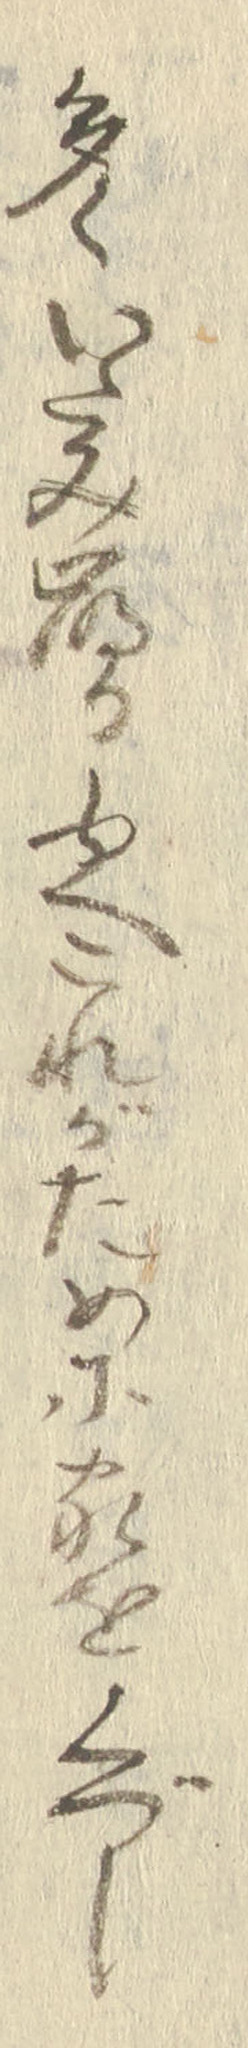多くいたみ崩るゆへこれがために家をくづし
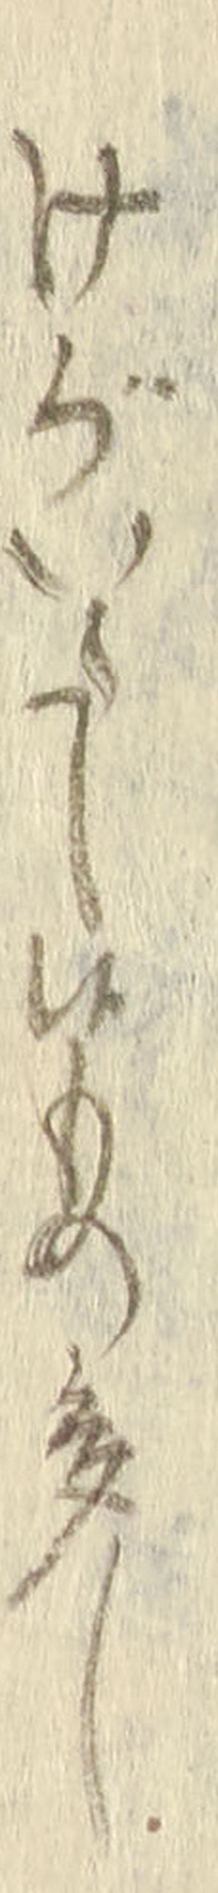けがいたし候もの多し
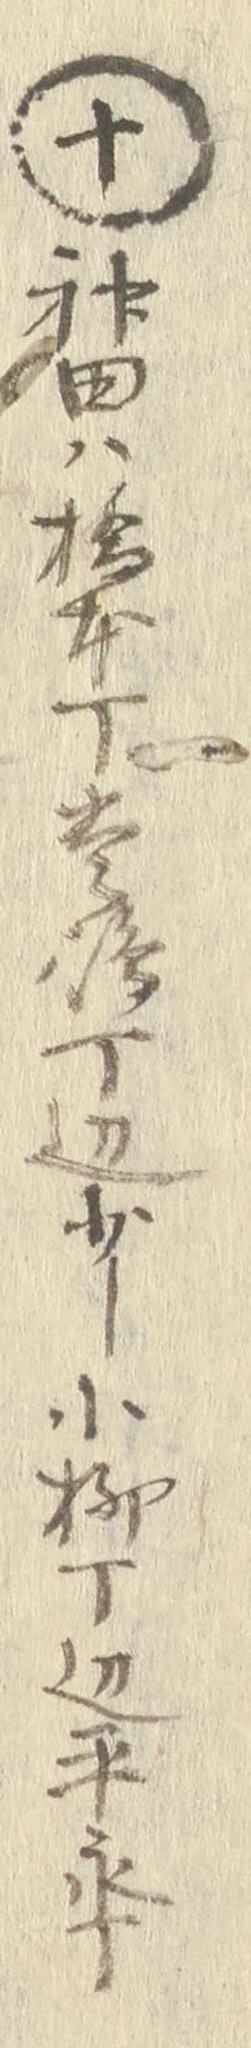十神田ハ橋本丁豊嶋丁辺少し小柳丁辺平永丁
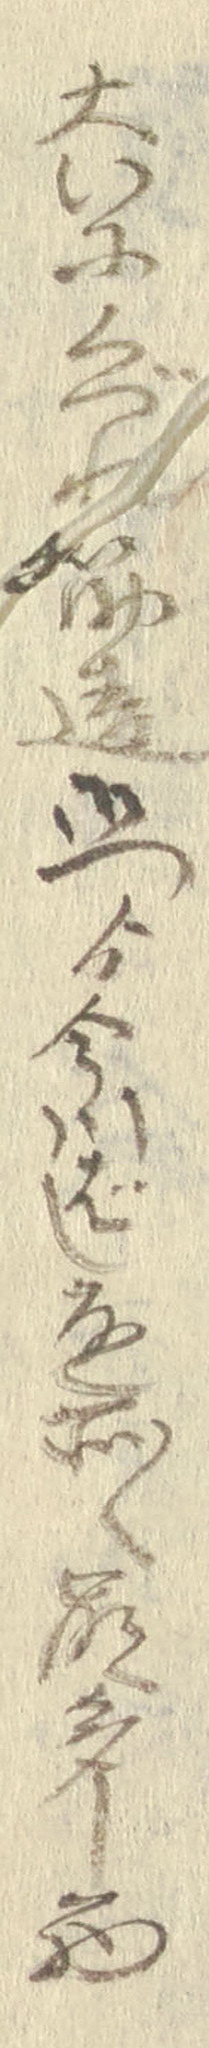大いにくづれ筋違御門ゟ今川ばし通所〳〵崩多し西
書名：御府内御屋敷方市中共地震類焼場所明細書之冩兼街道筋近郷聞書
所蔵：東京大学総合図書館 General Library in the University of Tokyo, JAPAN
